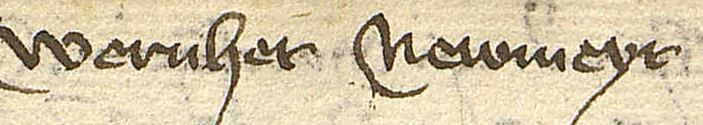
Wernher Newmeyr
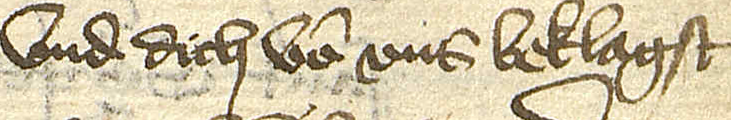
vnd dich vo* vns beklagſt
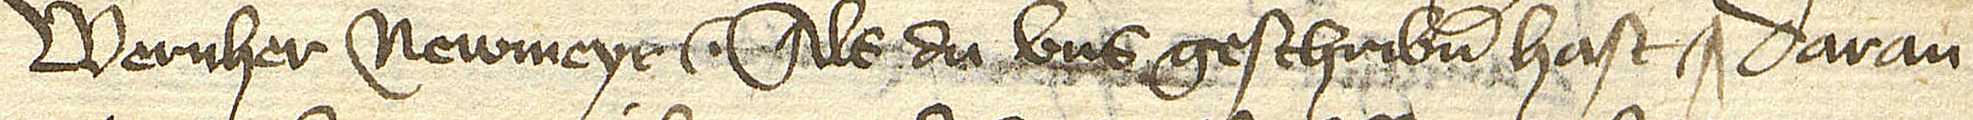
Wernher Newmeyr / . Als du vns geſchribn* haſt / Daran
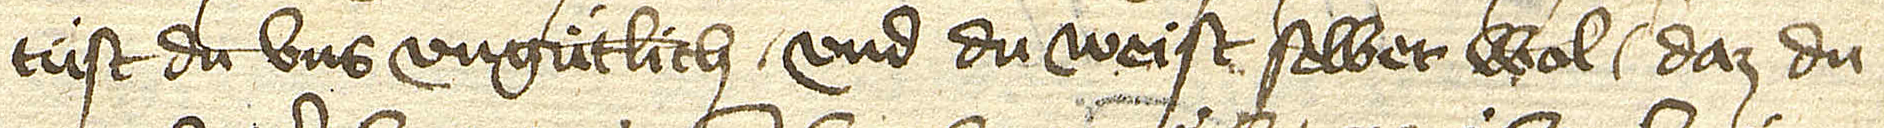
tüſt du vns vngütlich / vnd du weiſt ſelber wol / daʒ du
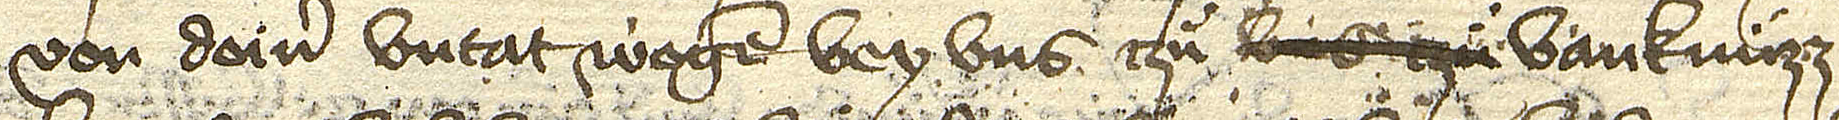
von dein* vntat wege* bey vns cʒü vns cʒü vanknüʒʒ
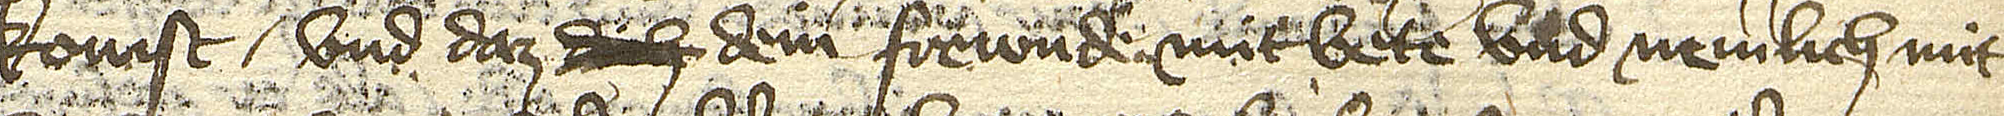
komſt / vnd daʒ dich dein frewnde mit bete vnd nemlich mit
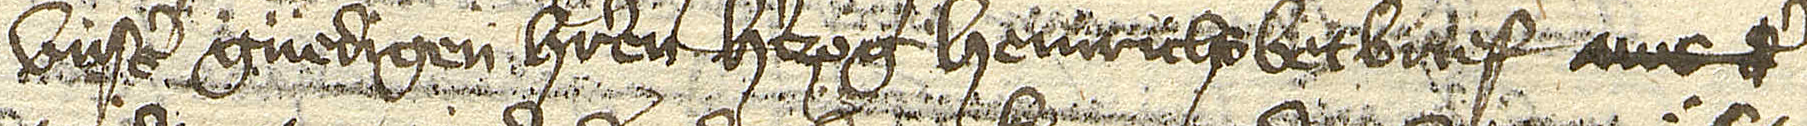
vnſs* gnedigen hr*en h*cʒog heinrichs betbrief aws d*
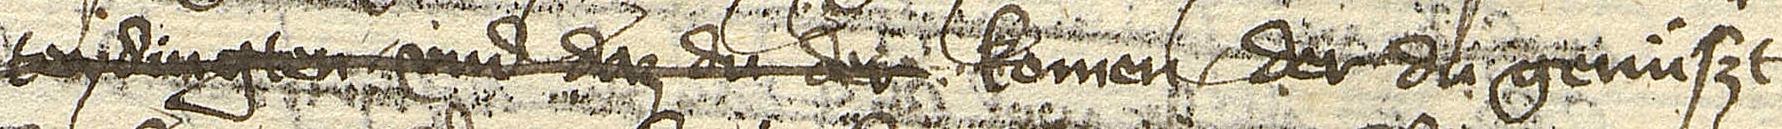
teydingten / vnd daʒ du der komen / der du genüſʒt
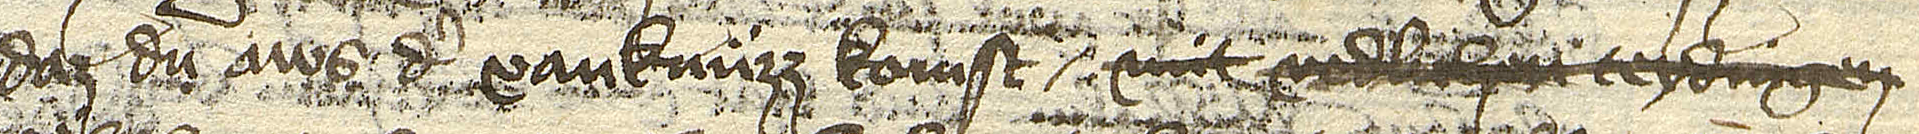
daʒ du aws d* vanknüʒʒ komſt / mit redlichen teydingen
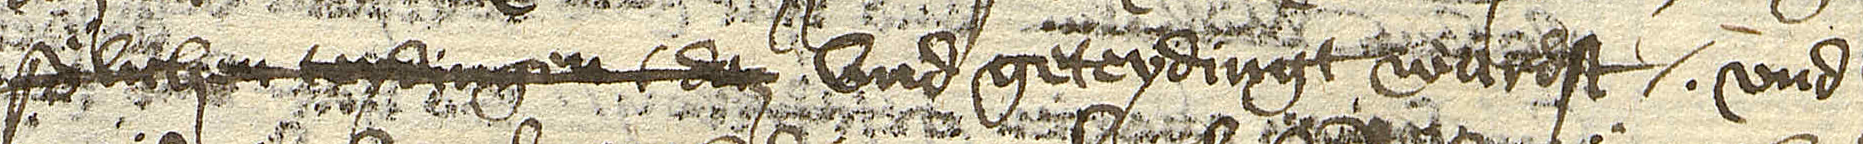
ſölichen teydingen / daʒ vnd geteydingt würdſt / . vnd
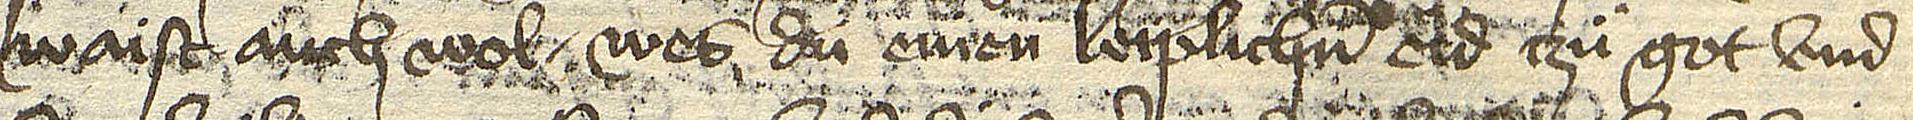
waiſt auch wol / wes du einen leiplichn* eid cʒü got vnd
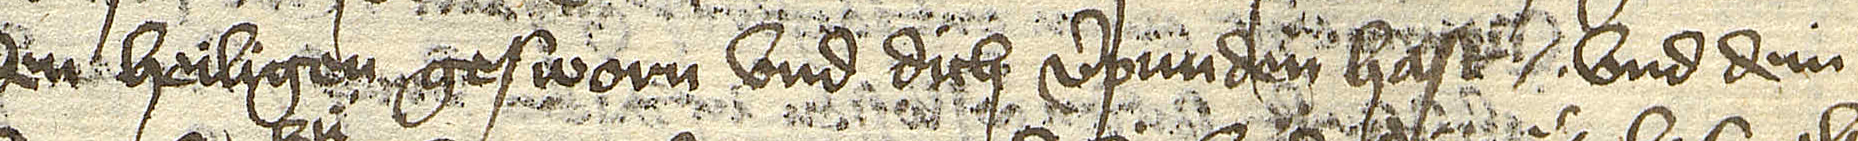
den heiligen geſworn vnd dich v*punden haſt / . vnd dein
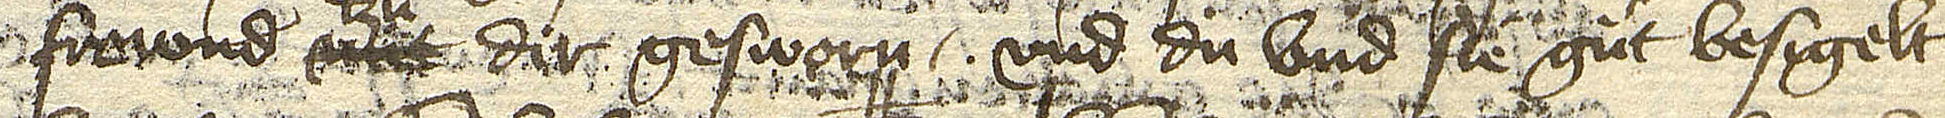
frewnd mit dir geſworn / . vnd du vnd ſie güt beſigelt
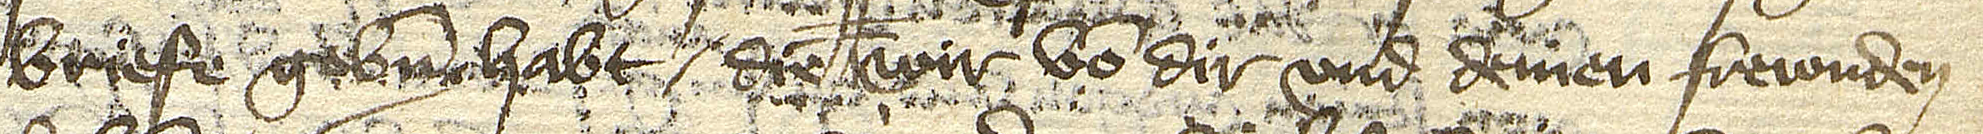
briefe gebn* habt / die wir vo* dir vnd deinen frewnden
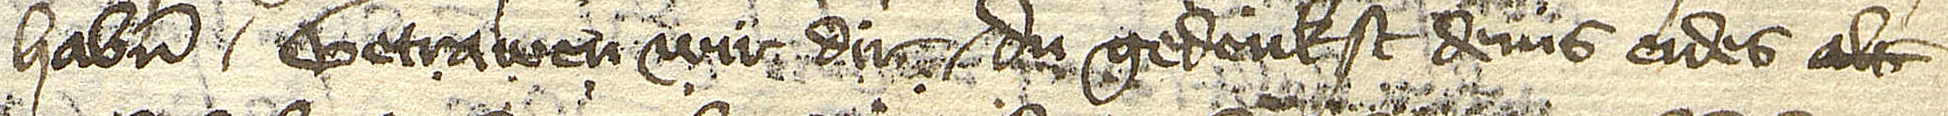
habn* / Getrawen wir dir / du gedenkſt deins eides als
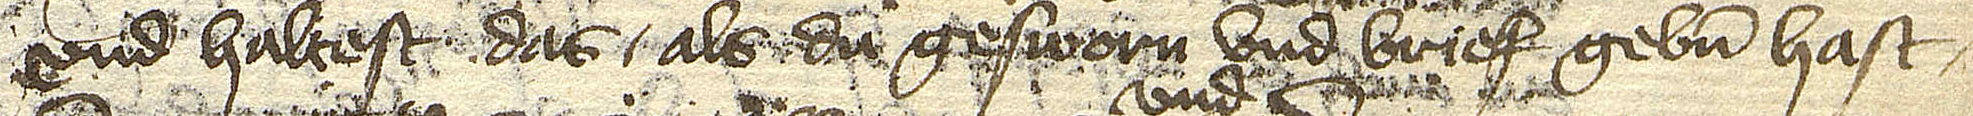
vnd halteſt das / als du geſworn vnd brief gebn* haſt /
